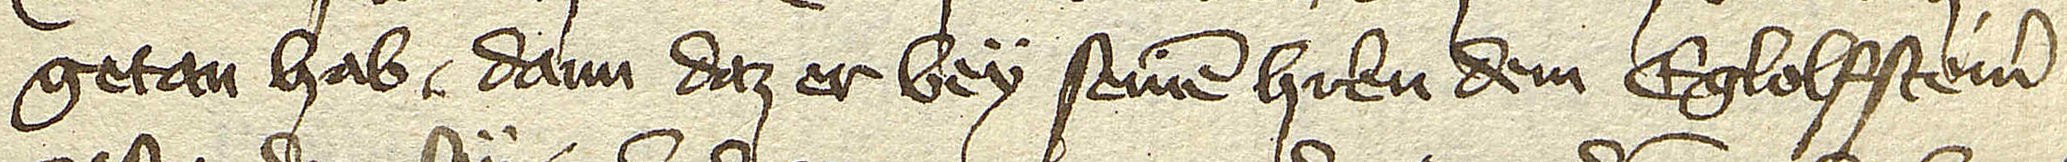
getan hab / dann daʒ er bey ſeine* hr*en dem Eglolfſtein*
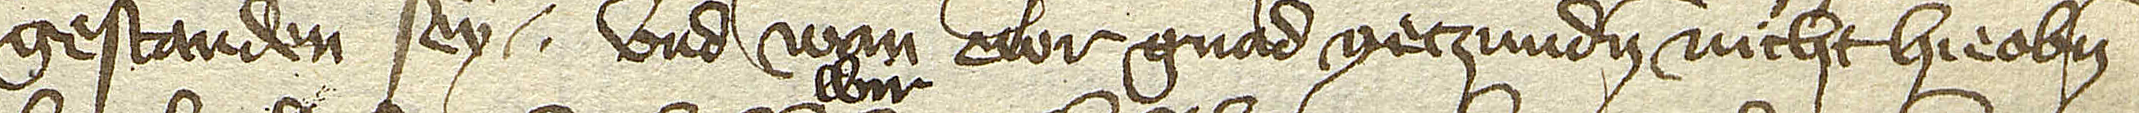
geſtanden ſey / . vnd wan ewr gnad yecʒundn* nicht hie obn*
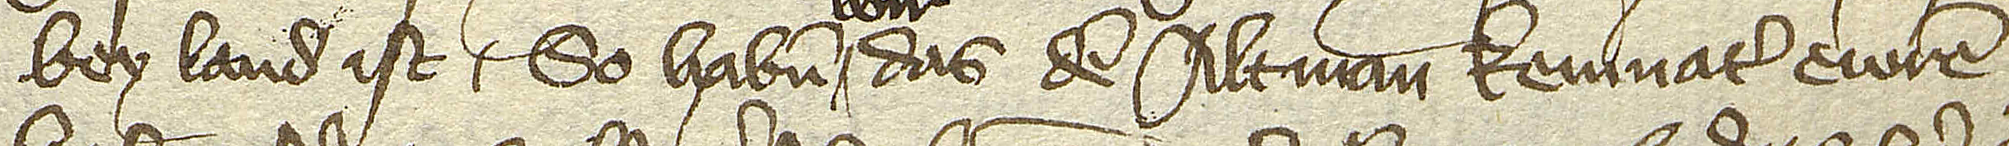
bey land iſt / So habn* das d* Altman kemnat* ewre*
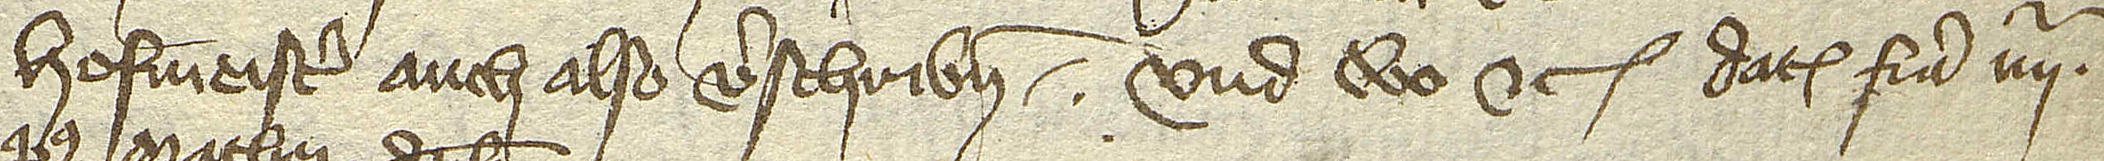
hofmeiſt* auch alſo v*ſchribn* / . vnd wo ec* dat* fia* iiii* .
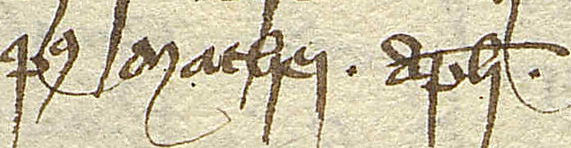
p* Mathei . Apli* .
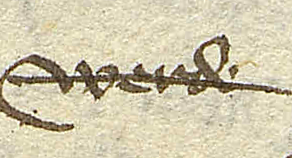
werde
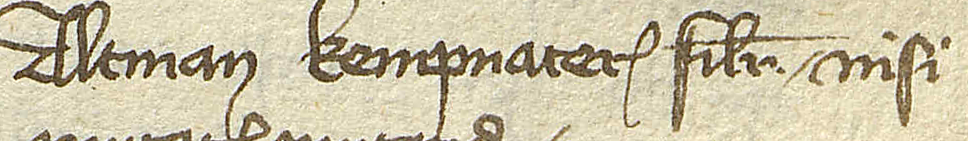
Altman kempnater* ſilr* . / niſi
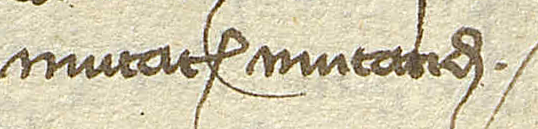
mutat* mutand* . /
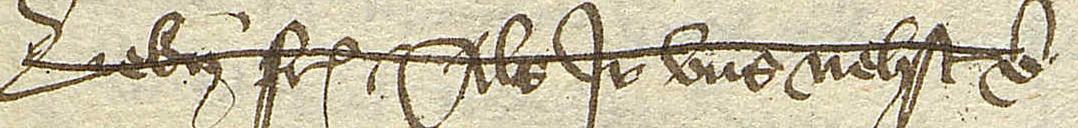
Lieb*n fr* / Als vns nehst v*
